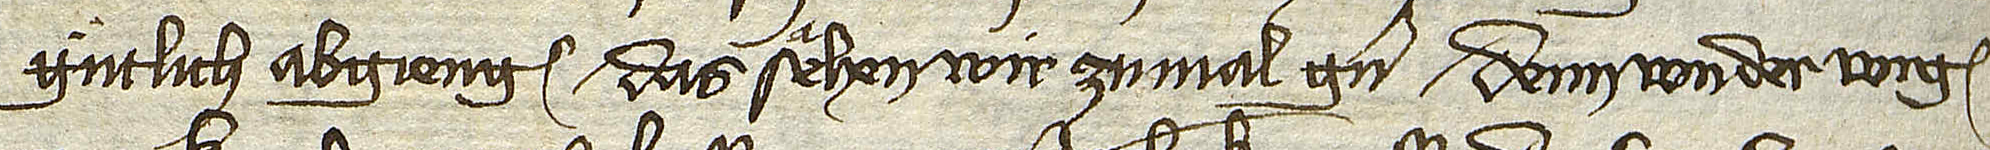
gütlich abgieng* / das ſëhen wir ʒumal gn* / Denn von der vorg*
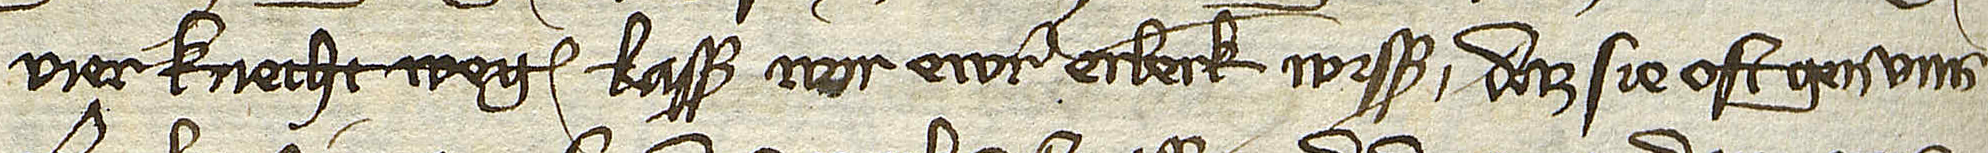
vier knecht weg* laſſ* wir ewr* erberk* wiſſ* / daʒ ſie oft gen vns
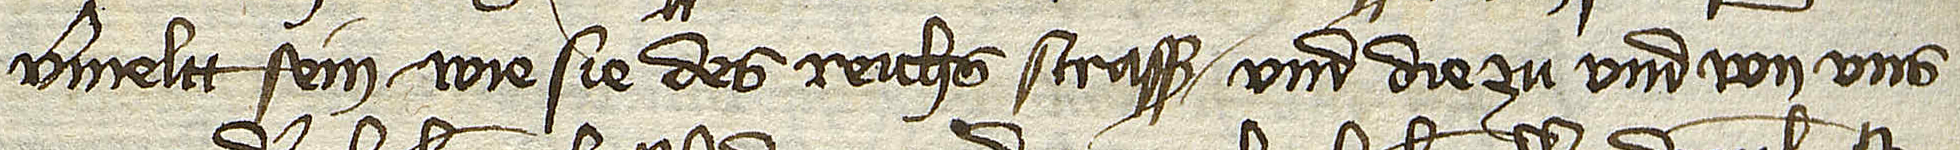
v*meltt ſein / wie ſie des reichs ſtraſſ* / vnd die ʒu vnd von vns
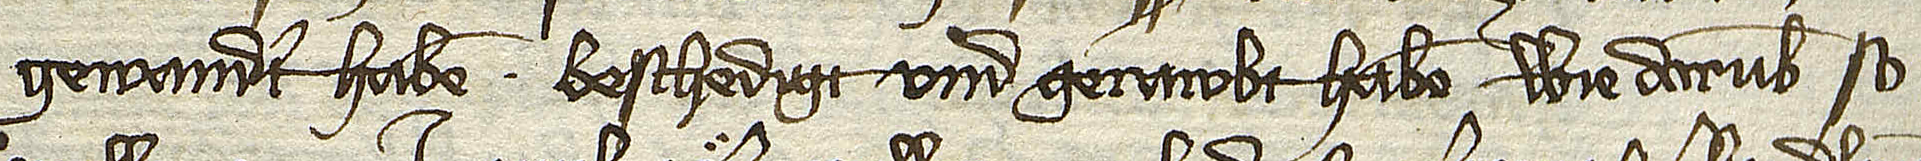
gewand*t habe* . beſchedigt vnd gerawbt habe* Wie darub* ſo
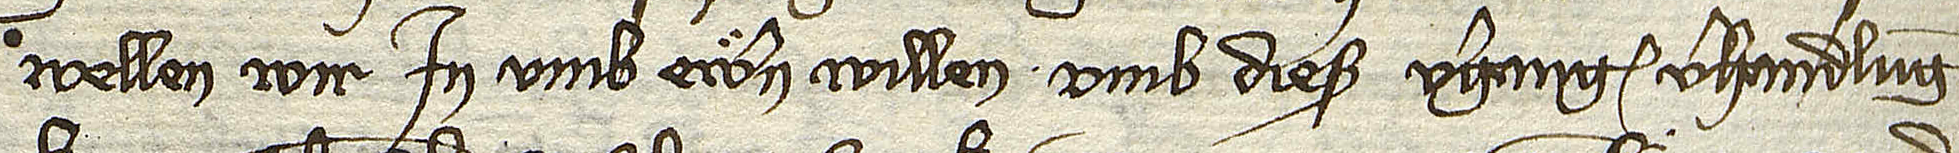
wellen wir In vmb ew*n willen . vmb dieſ* v*gang* v*handlug*
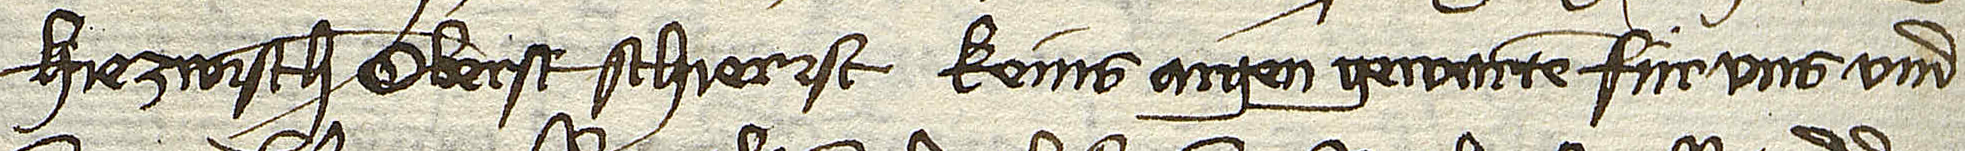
hieʒwiſch* Oberſt ſchieriſt keins argen gewarte* für vns vnd
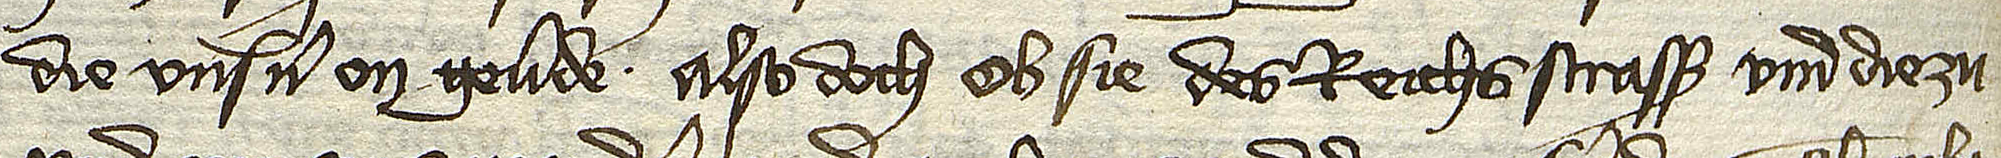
die vnſn* on geu*de . Alſo doch Ob ſie des Reichs ſtraſſ* vnd die ʒu
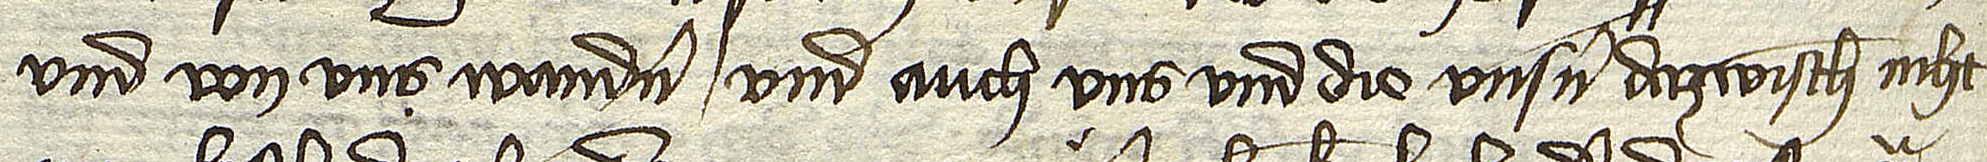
vnd von vns wand*n vnd auch vns vnd die vnſn* daʒwiſch* niht
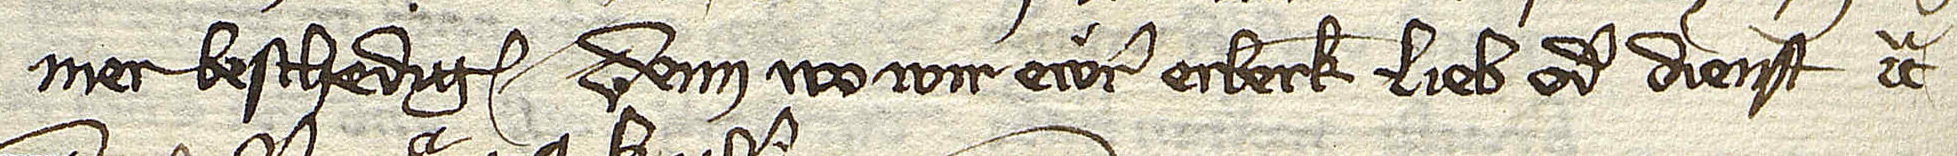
mer beſchedig* / Denn wo wir ewr* erberk* lieb od* dienſt ec*
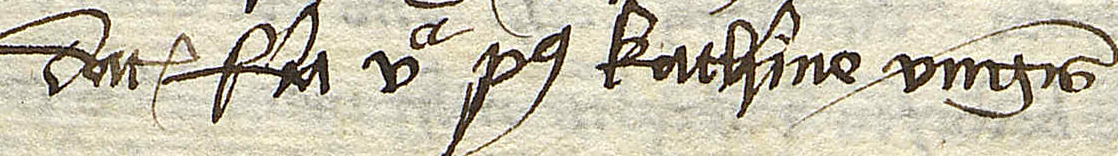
Dat* fi*a v* p* kath*ine virgis*
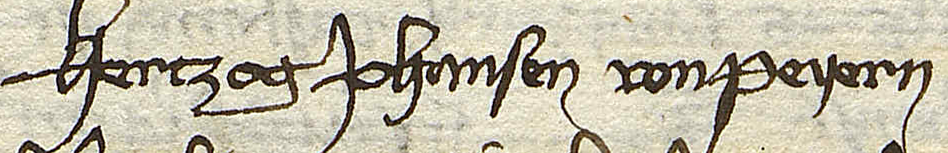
Hercʒog Iohanſen von Peyern
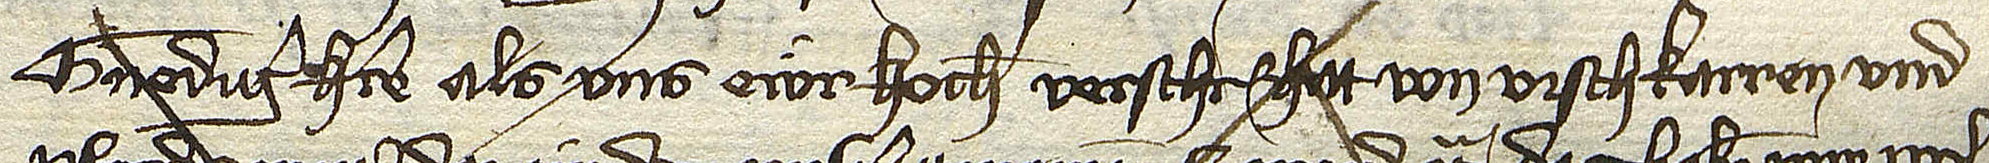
Gnedig* hr*e als vns ewr hoch* verſchr*hat von viſchkarren vnd
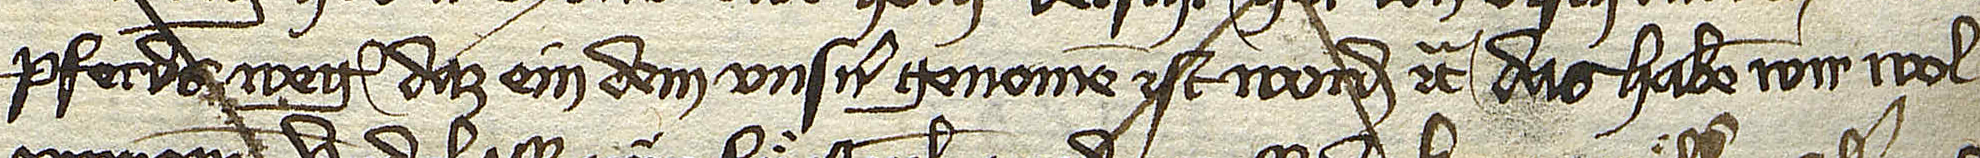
pferds weg* daʒ ein dem vnſn* genome* iſt word* ec* das habe* wir wol
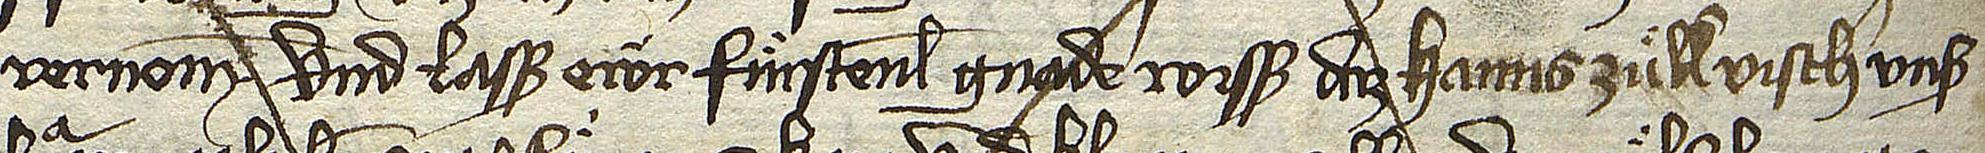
vernom* vnd laſſ* ewr fürſtenl* gnade wiſſ* daʒ Hanns ʒüllviſch* vnſ*
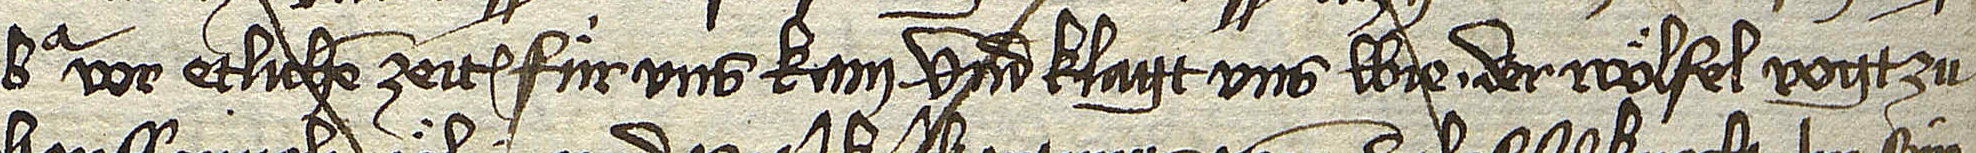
b* vor etliche* ʒeit* für vns kam Vnd klagt vns Wie . der wölfel vogt ʒu
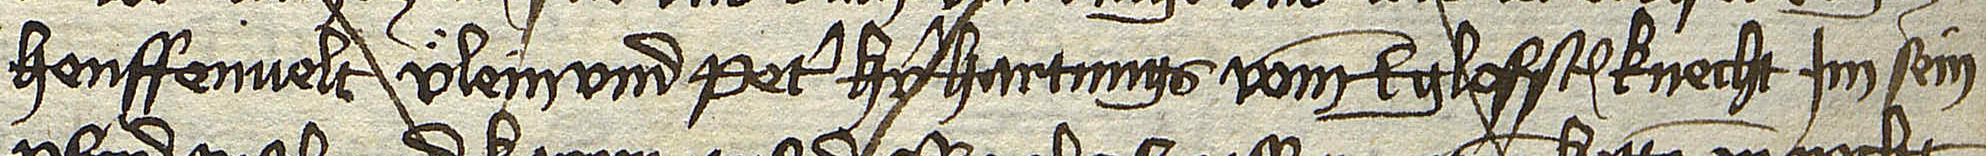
Henffenuelt v̈lein vnd pet* Hr* hartungs vom* Eglofſt* knecht Im ſein
